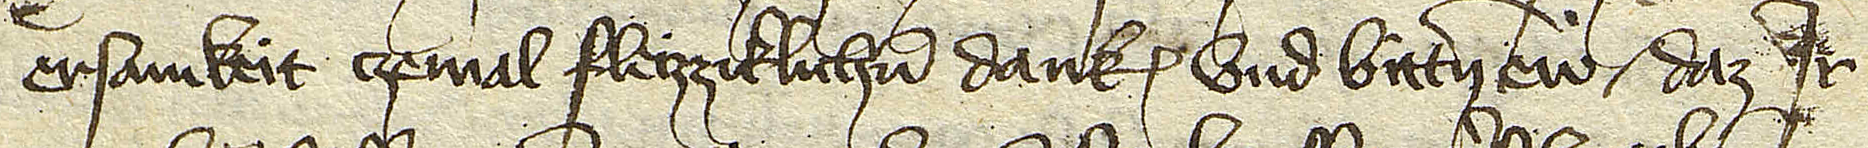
erſamkeit cʒemal fleiʒʒiklichn* dank* vnd bittn* ew / daʒ Ir
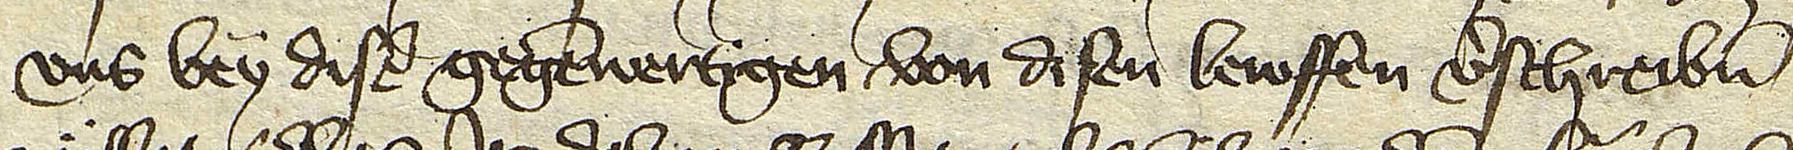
vns bey diſe* gege*wertigen / von diſen lewffen v*ſchreibn*
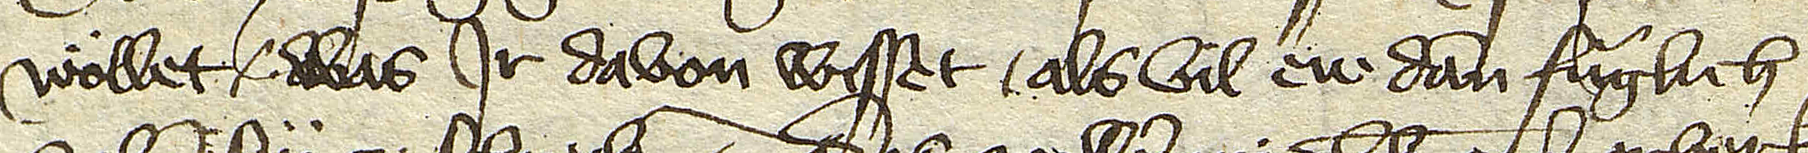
wöllet / was Ir davon wiſſet / als vil ew dan* füglich
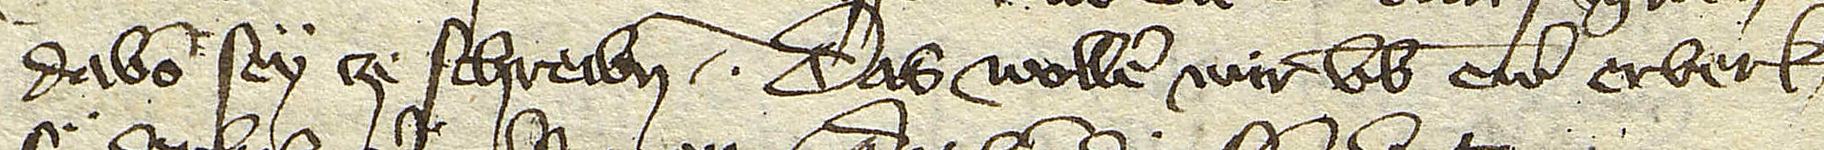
davo* ſey cʒe ſchreibn* / . Das wolle* wir vo* ew* erberk*
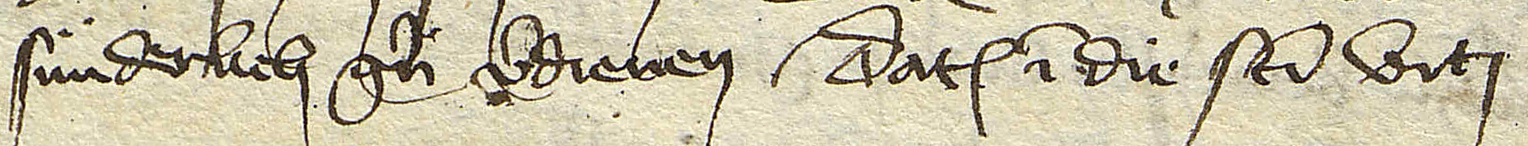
ſünderlich g*n v*dienen / Dat* i* die ſci* viti*
